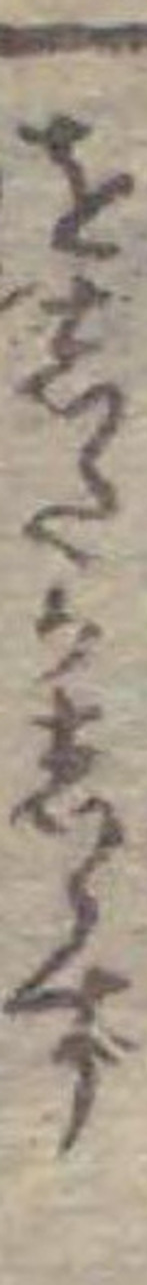をしたかしらず
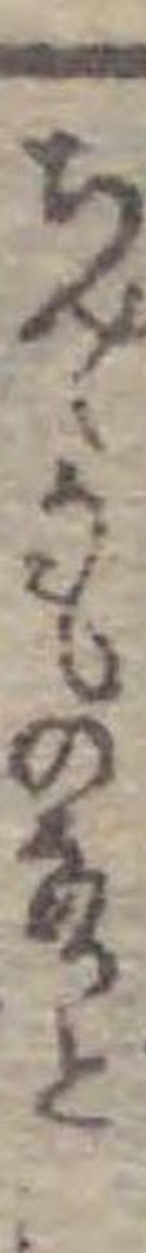ちん〳〵かものなかと
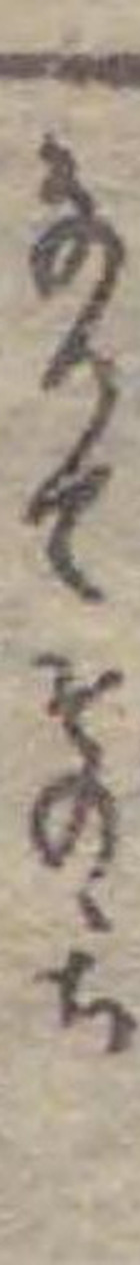なりてそのゝち
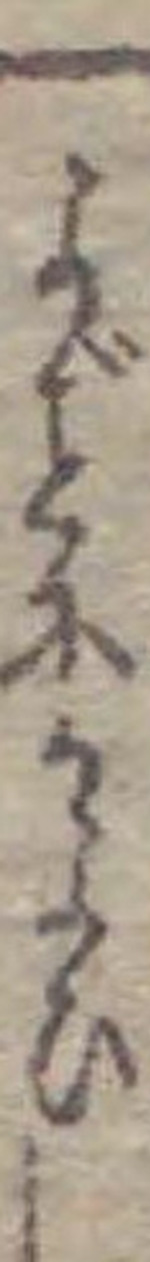よごとにかよひ
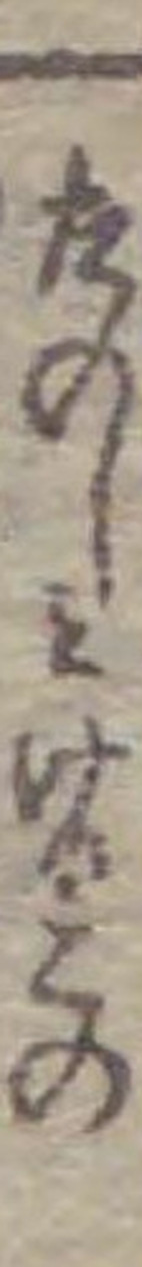たのしみけるこの
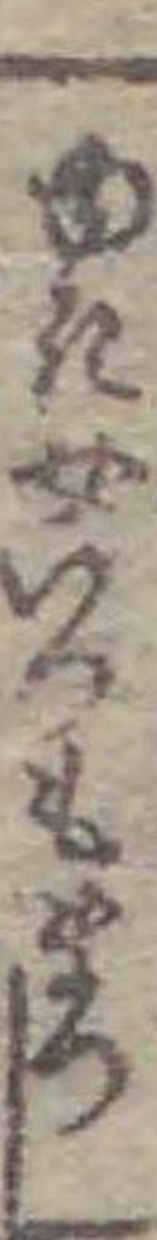ゆき女いつもまつ
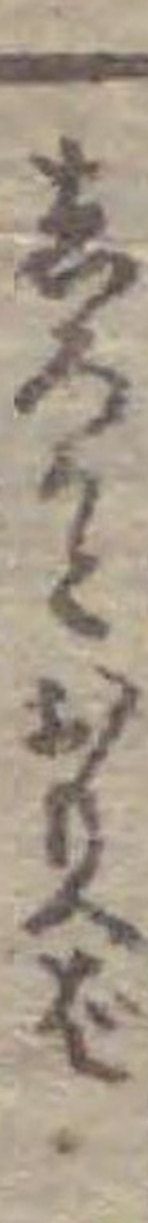しろかとおもへば
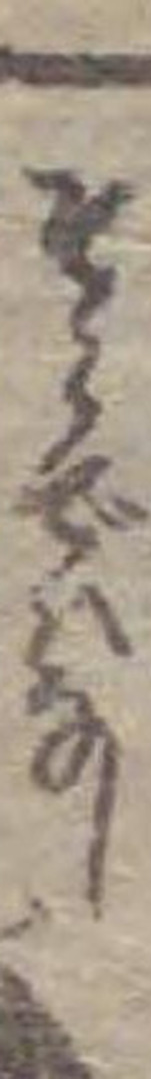そうではなし
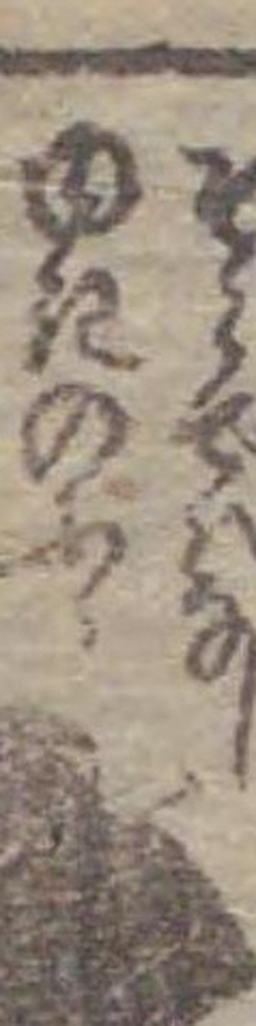ゆきのふら
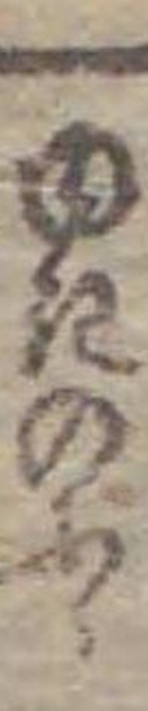ゆきのふら
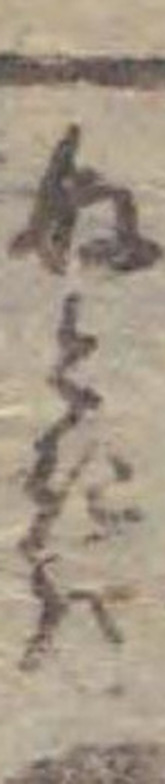ぬときは
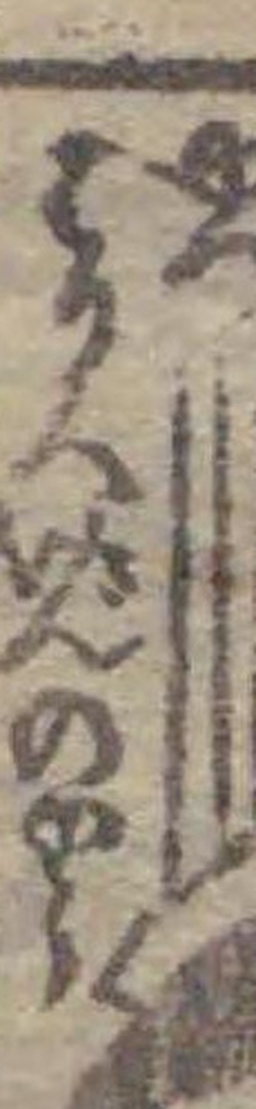はり人げんのやう
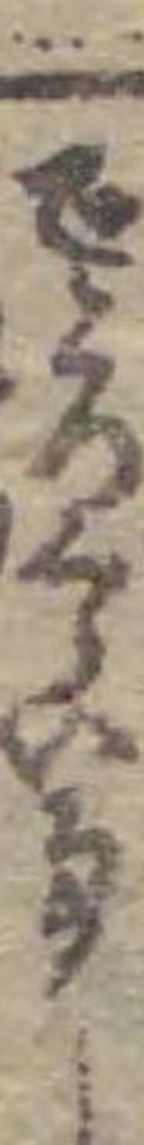でつくらい事
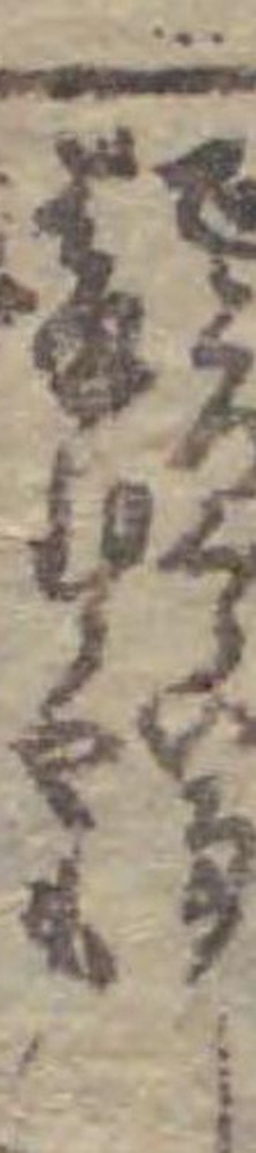はまむらやも
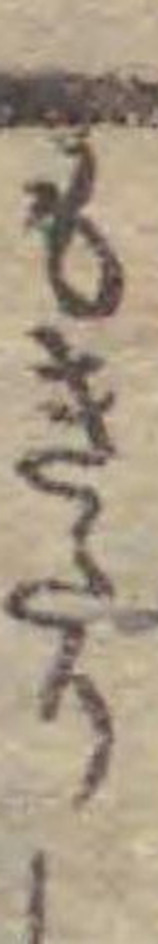もきたり
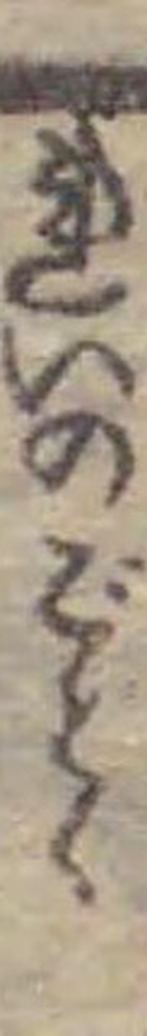れいのごとく
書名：[化物一代記] : 5巻
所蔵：国立国会図書館 National Diet Library, JAPAN
